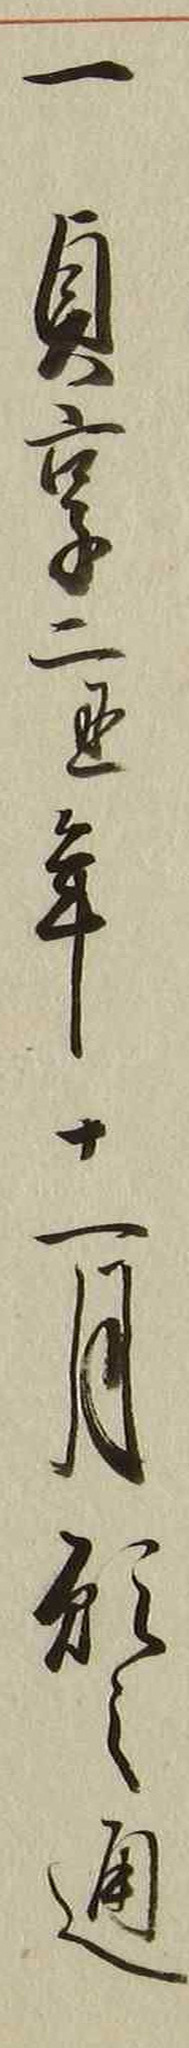一貞享二丑年十一月願之通
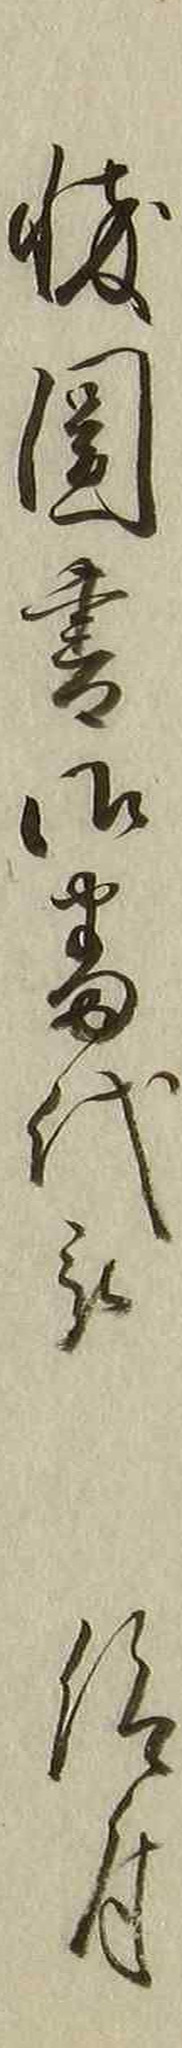忰図書御番代被仰付
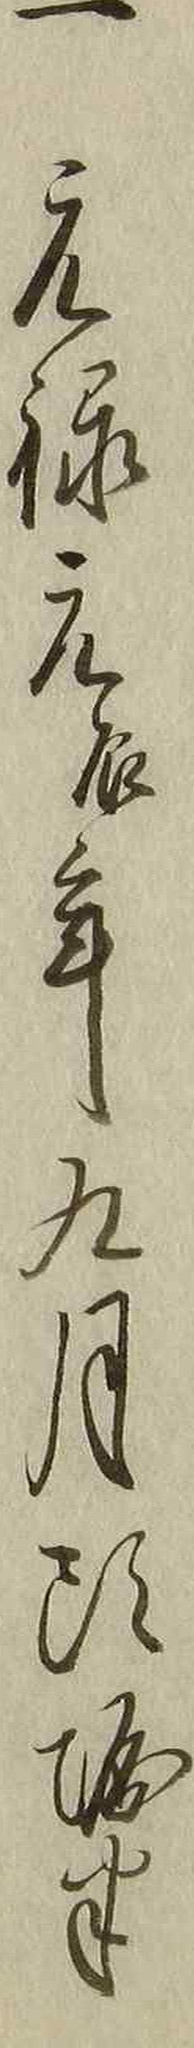一元禄元辰年九月頭堀半
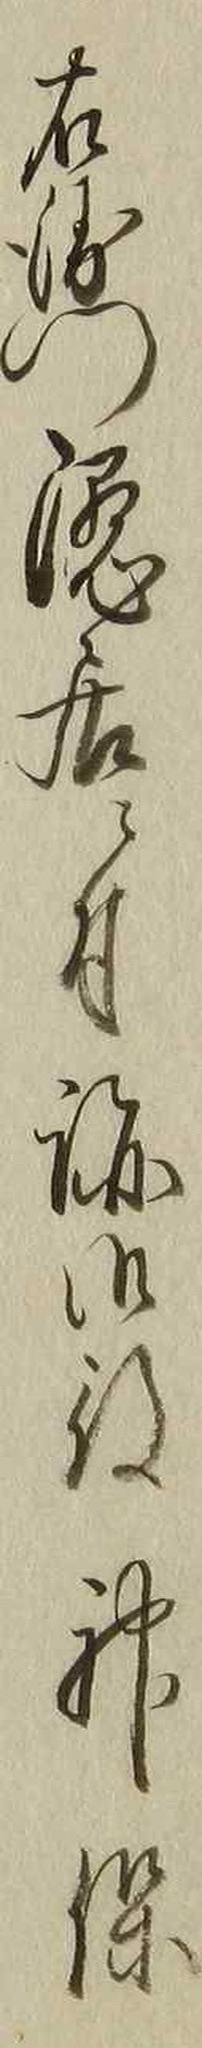右衛門隠居ニ付跡御役神保
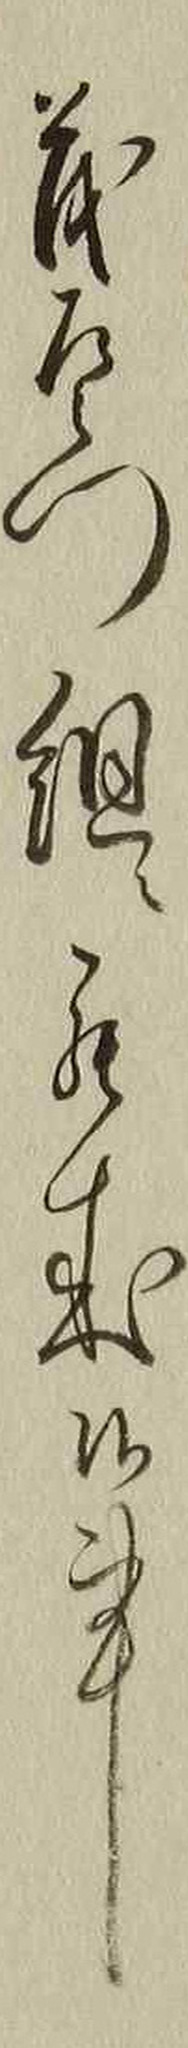茂左衛門組ニ罷成候事
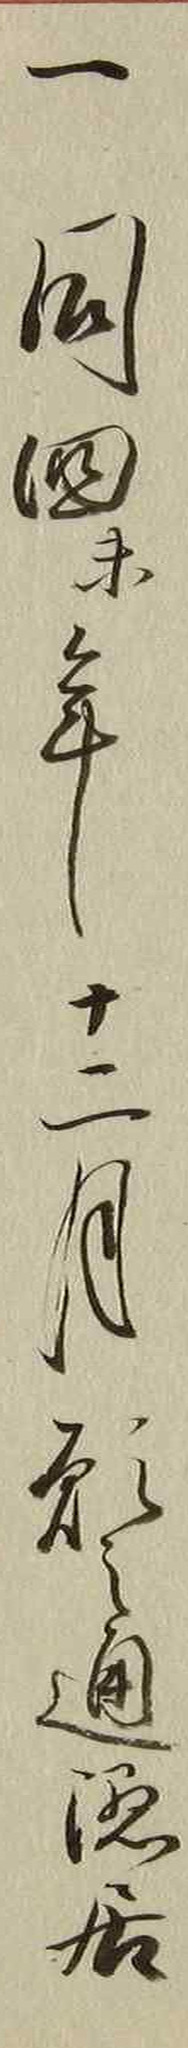一同四未年十二月願之通隠居
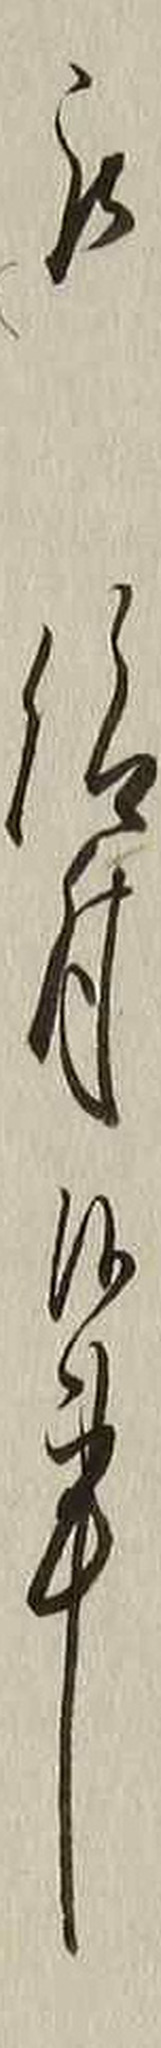被仰付候事
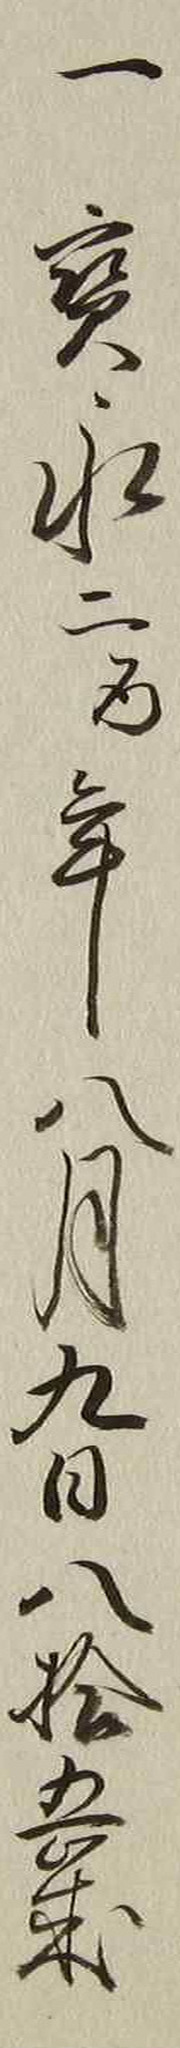一宝永二酉年八月九日八拾五歳
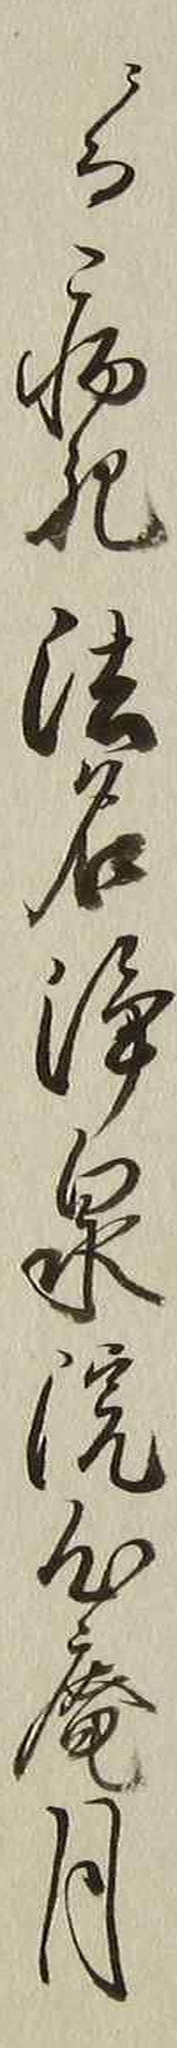ニ而病死法名浄泉院心庵月
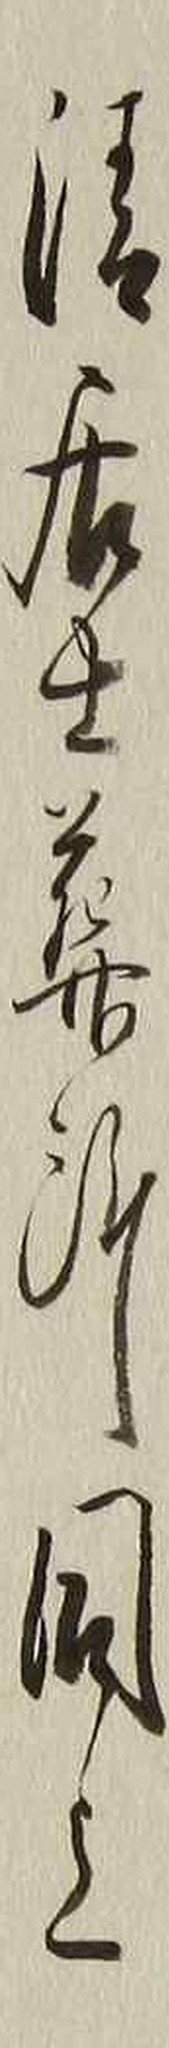清居士葬所同上
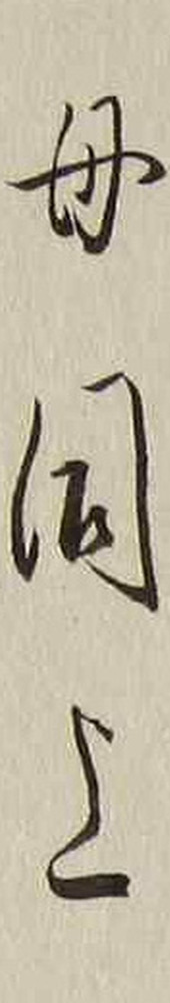母同上
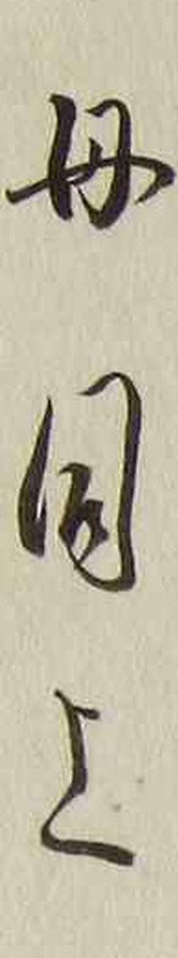母同上

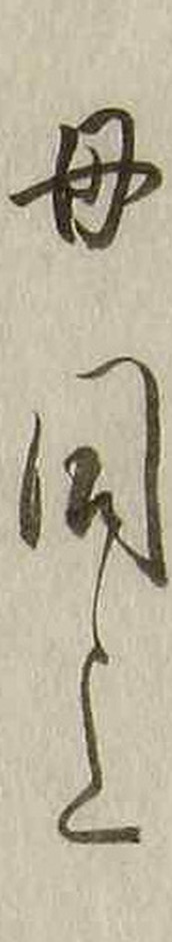母同上
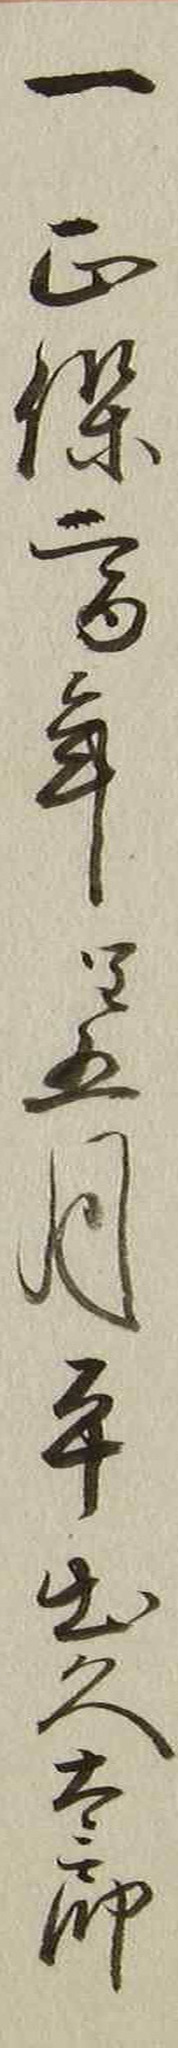一正保二酉年閏五月平出久太郎
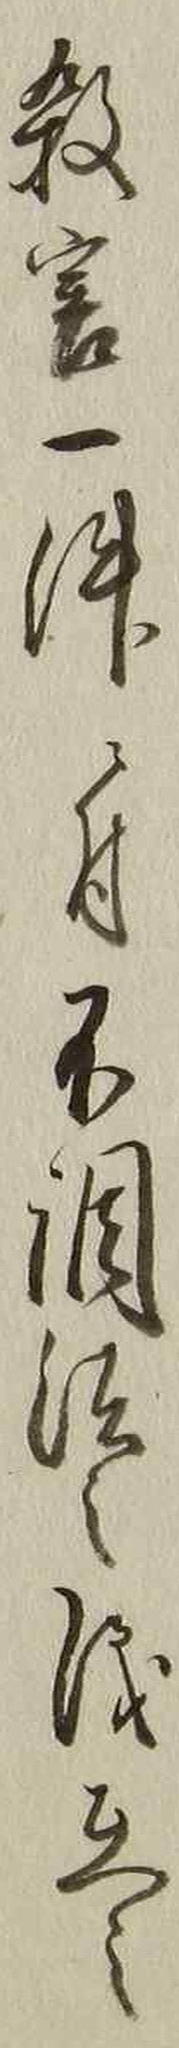殺害一件ニ付無調法之儀在之
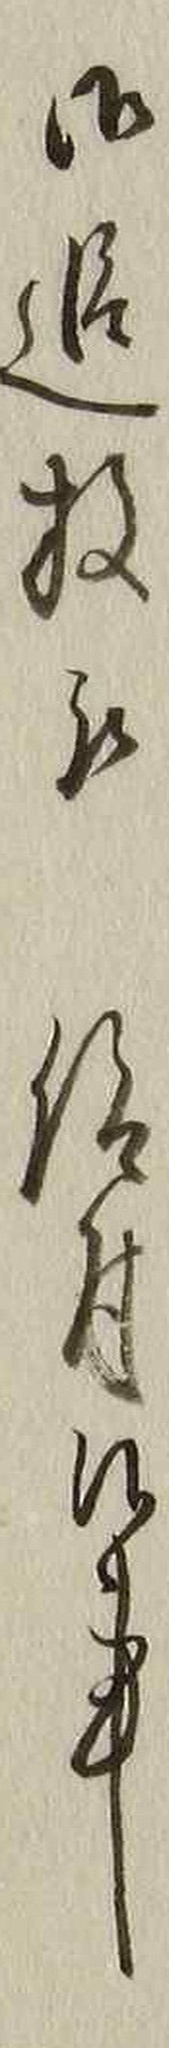御追放被仰付候事
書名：諸士系譜　巻之18　い之部18
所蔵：会津若松市立会津図書館
